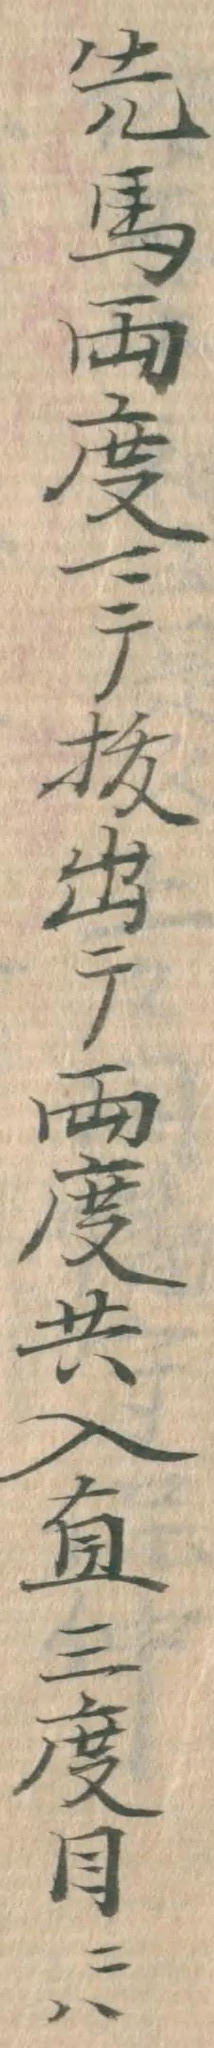先馬両度マテ抜出テ両度共入直三度目ニハ
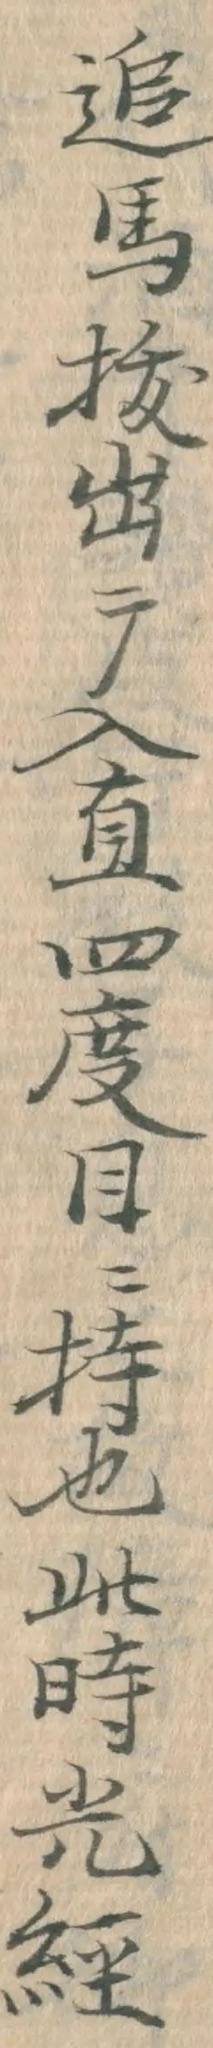追馬抜出テ入直四度目ニ持也此時光経
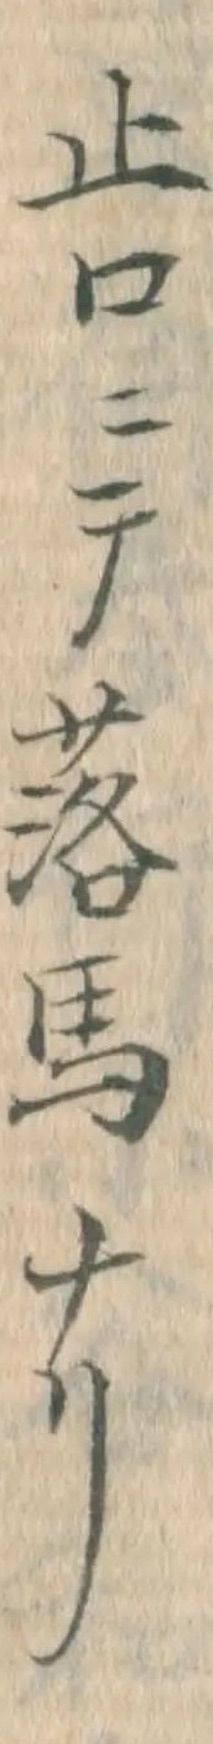止口ニテ落馬ナリ
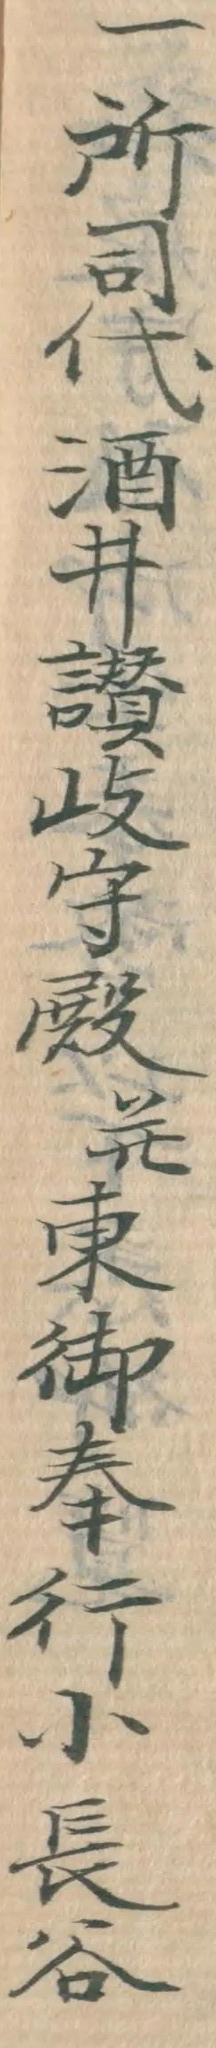一所司代酒井讃岐守殿并東御奉行小長谷

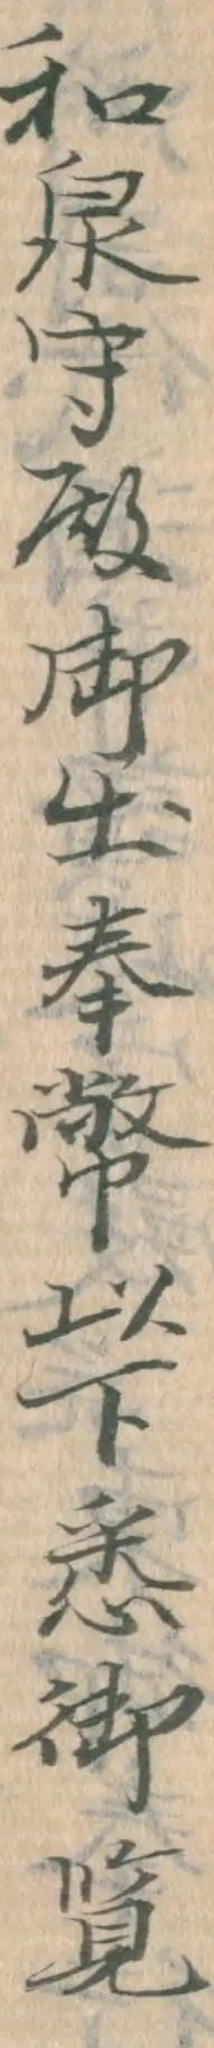和泉守殿御出奉幣以下悉御覧
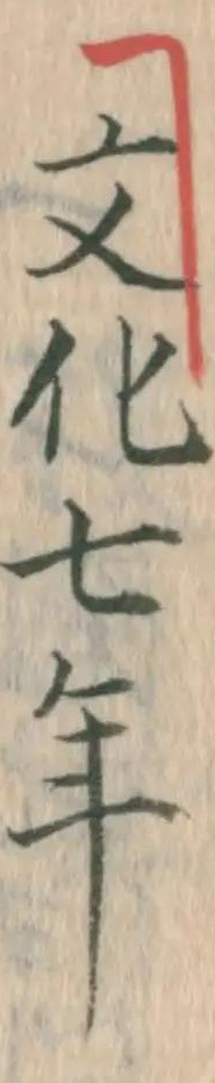文化七年
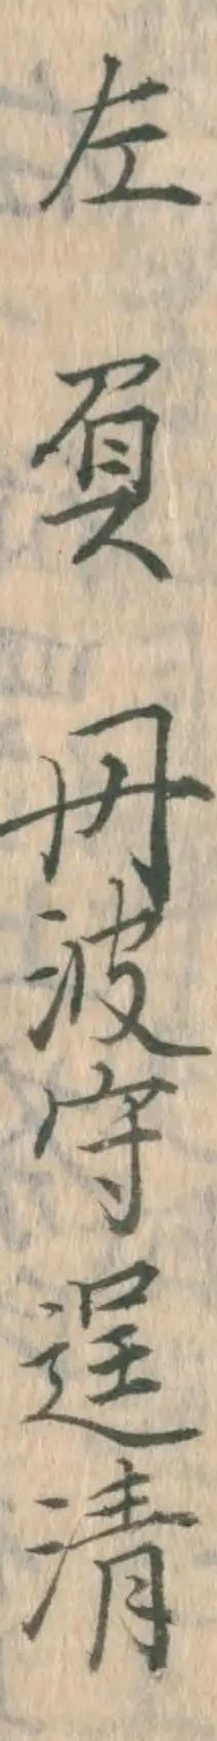左負丹波守逞清
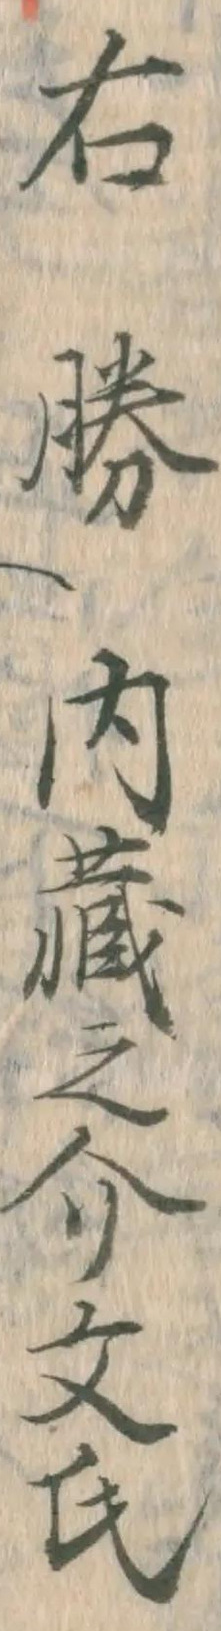右勝内蔵之介文氏
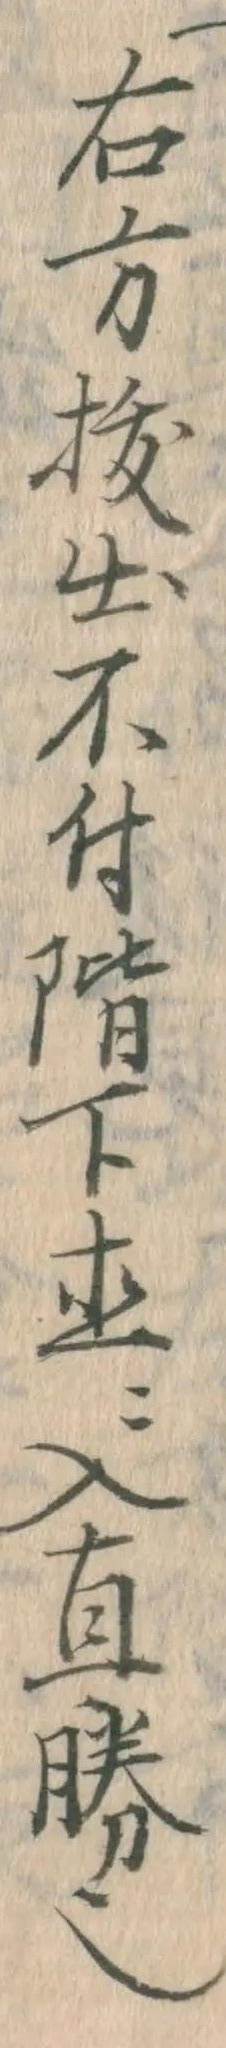(右方抜出不付階下直ニ入直勝也
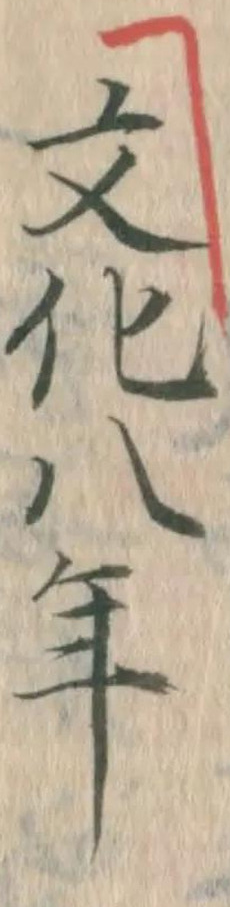文化八年
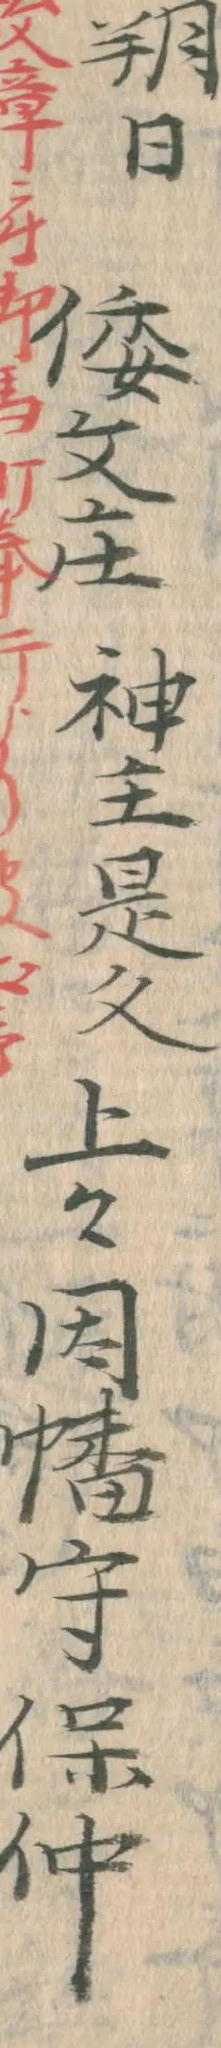朔日倭文庄神主是久上々因幡守保仲
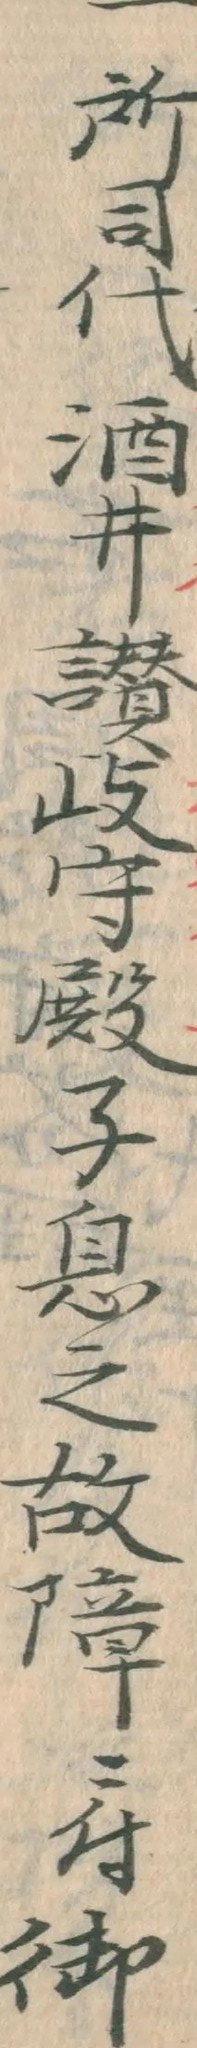一所司代酒井讃岐守殿子息之故障ニ付御
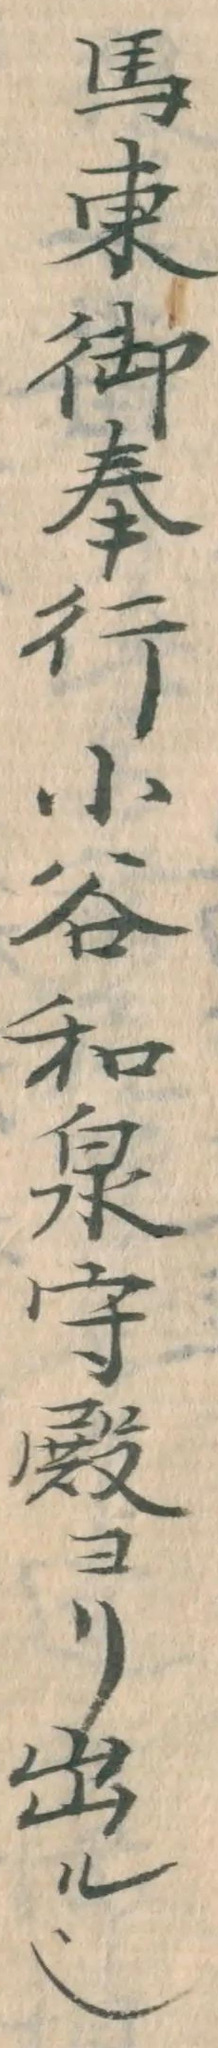馬東御奉行小谷和泉守殿ヨリ出ル也

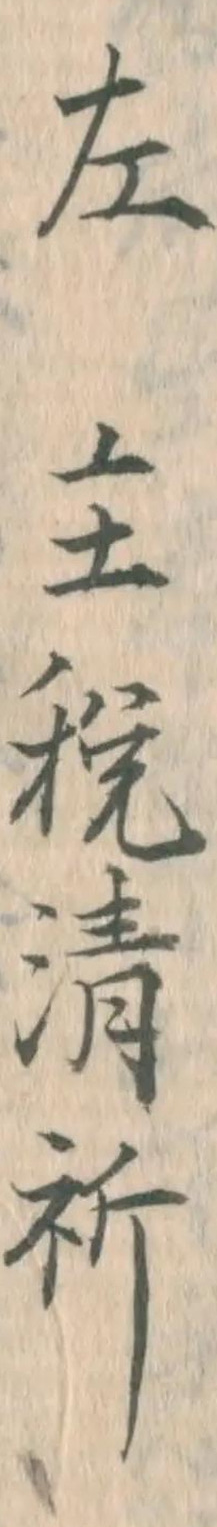左主税清祈
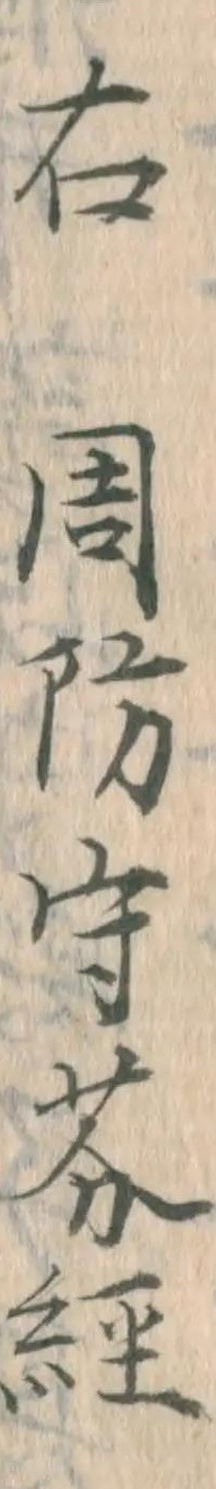右周防守芬経
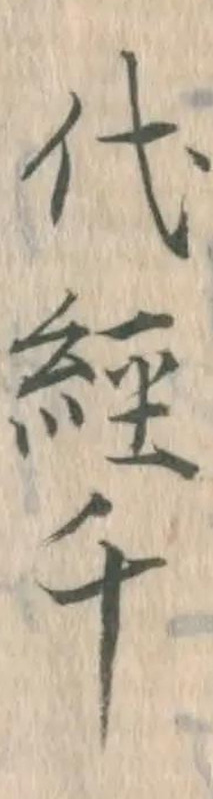代経千
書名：賀茂社記録. 第10冊
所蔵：国立国会図書館 National Diet Library, JAPAN
